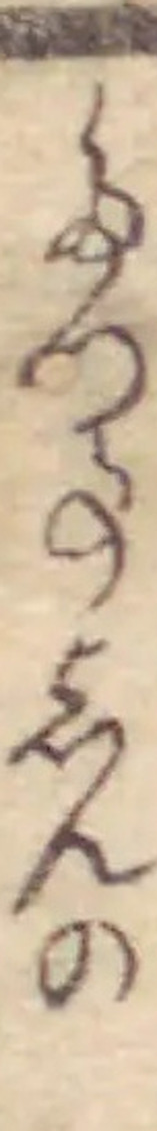たつ事しんの

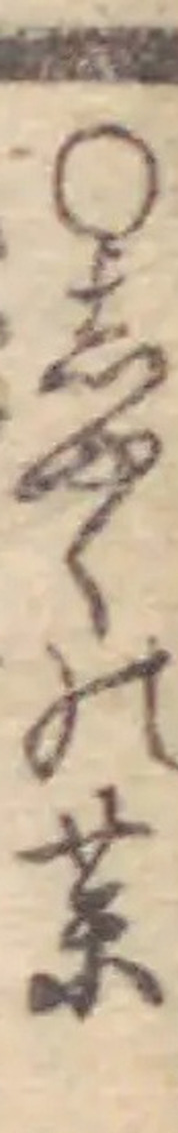○しやくの薬
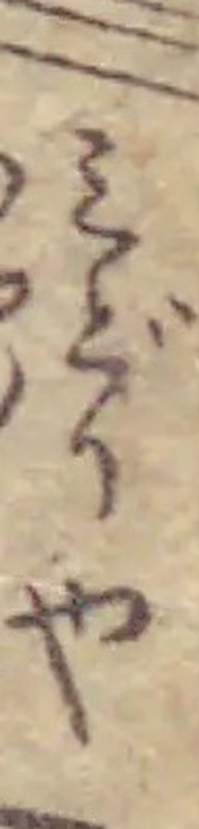みどりや
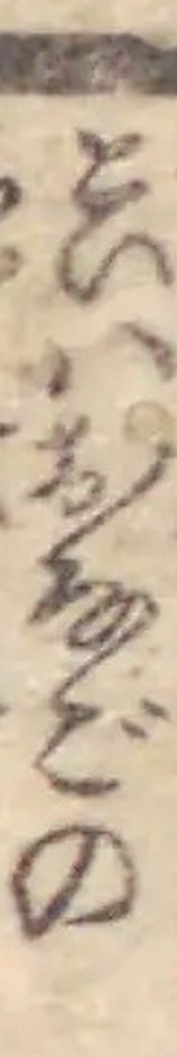こいはおなごの
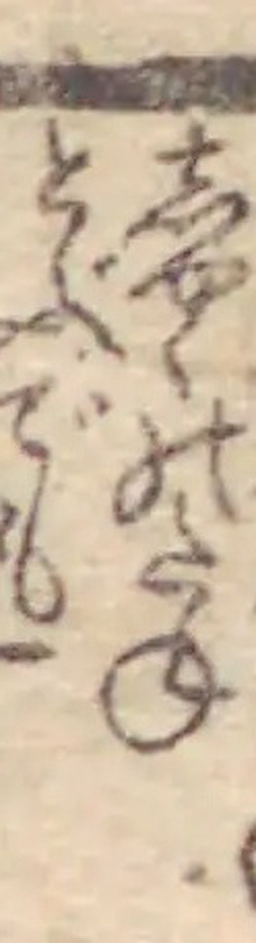とぶでも
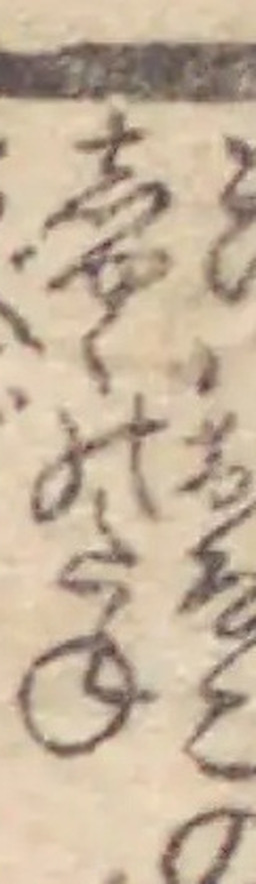しやくのたね
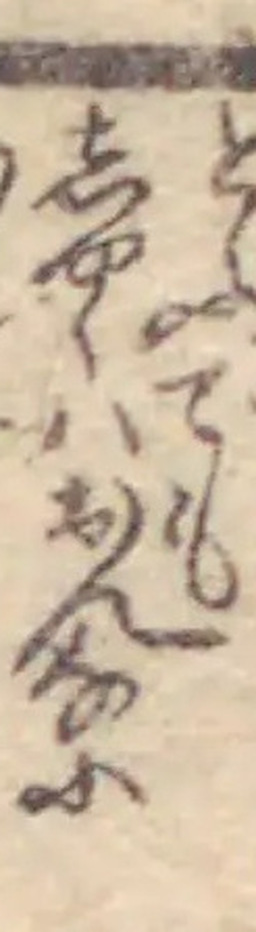しやくはおんなに
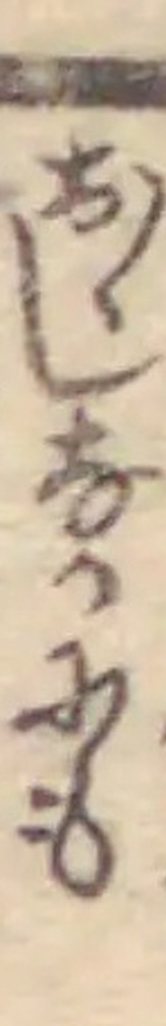おゝしなかにも
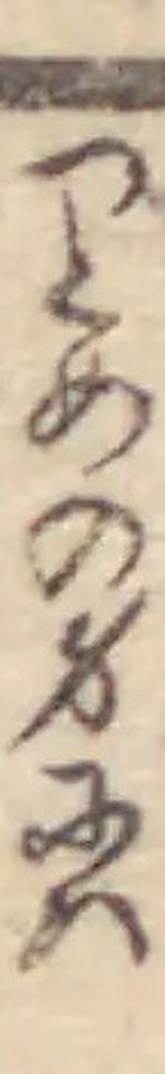つとめの身には
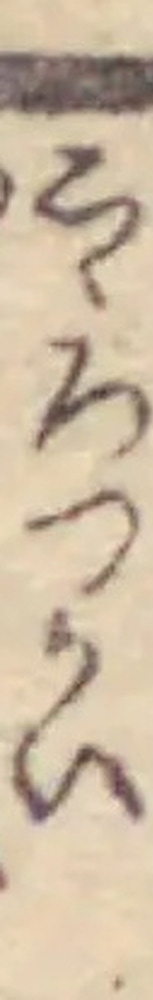こゝろつかい
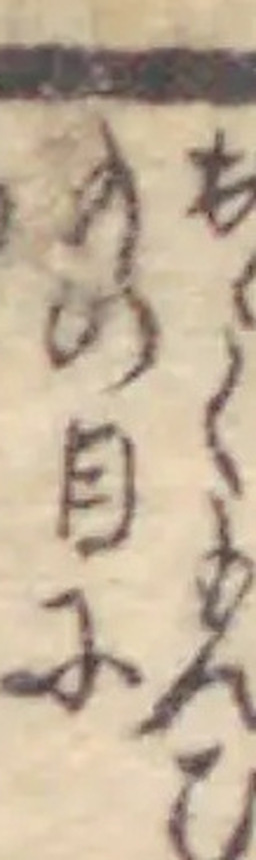もの目に
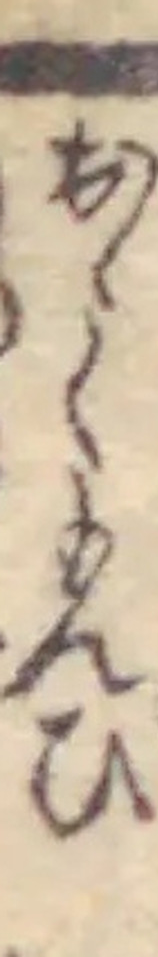おゝくもんひ
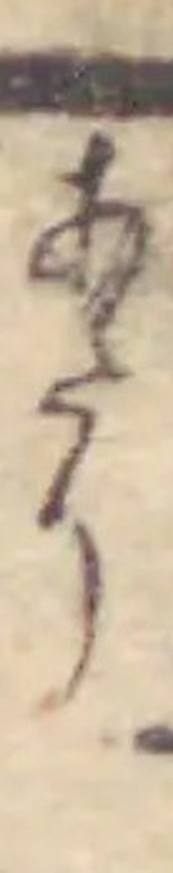あたり
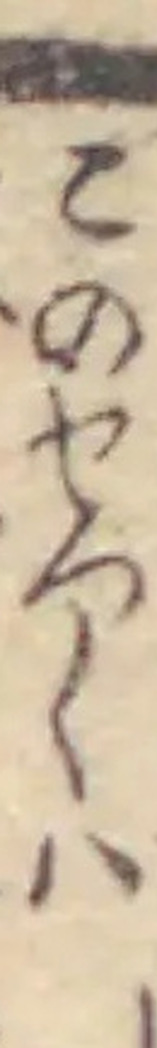このせつくは
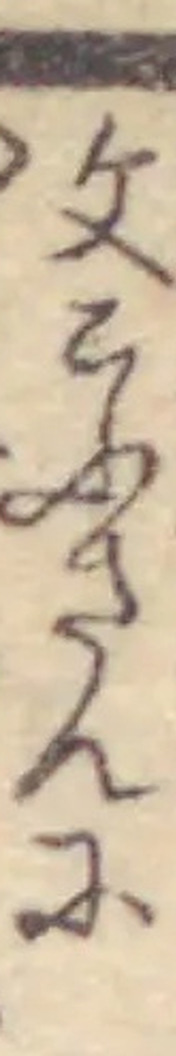文こふさんに
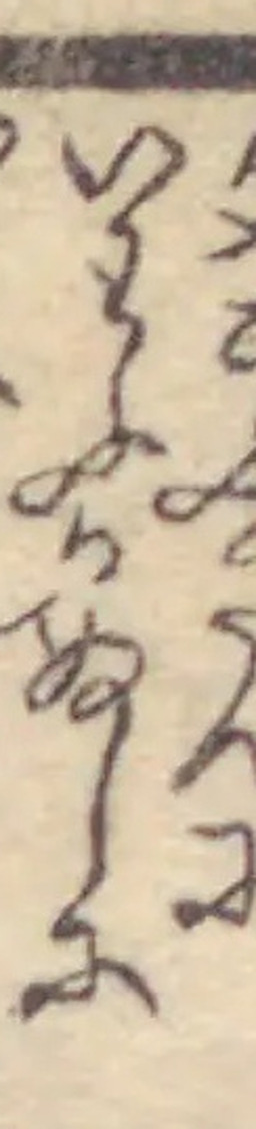いわふかぬしに
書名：家伝寿命薬 2巻
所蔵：国立国会図書館 National Diet Library, JAPAN
